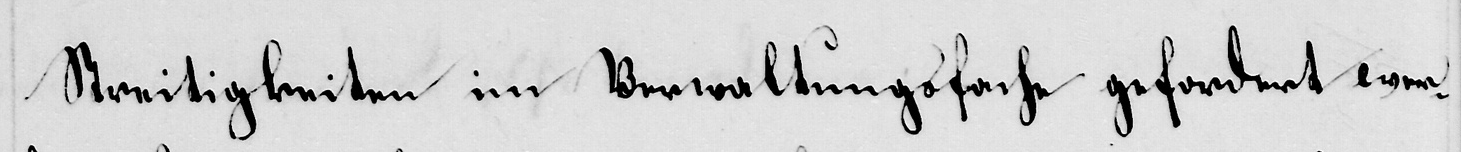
Streitigkeiten im Verwaltungsfache gefordert wer¬
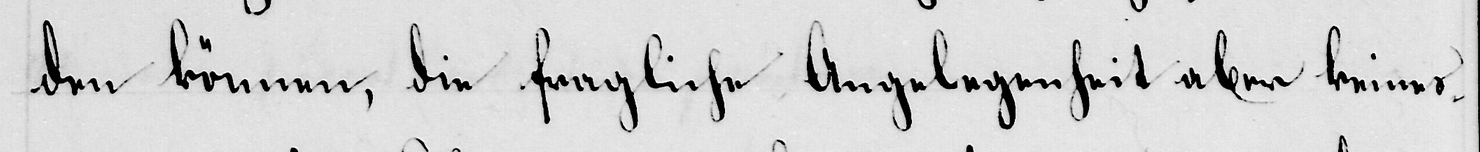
den können, die fragliche Angelegenheit aber keines¬
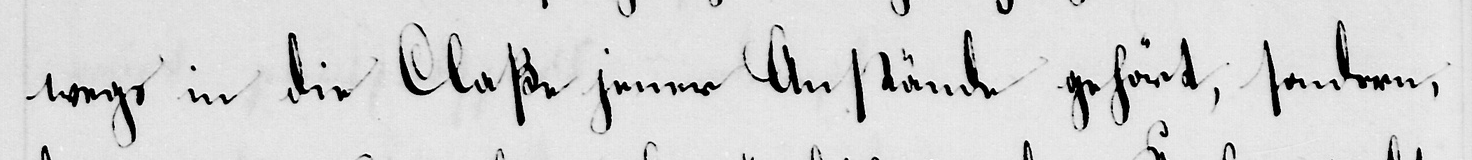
wegs in die Claße jener Anstände gehört, sondern,
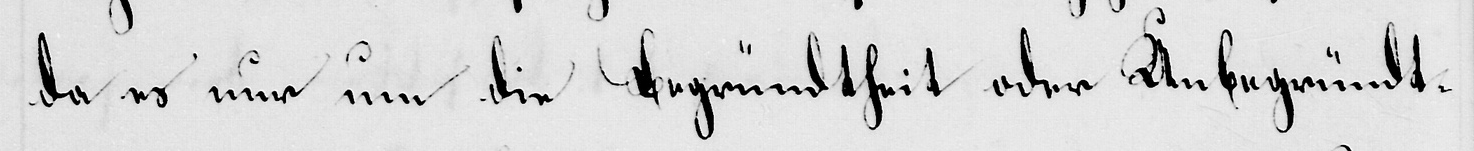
da es nur um die Begründtheit oder Unbegründt¬
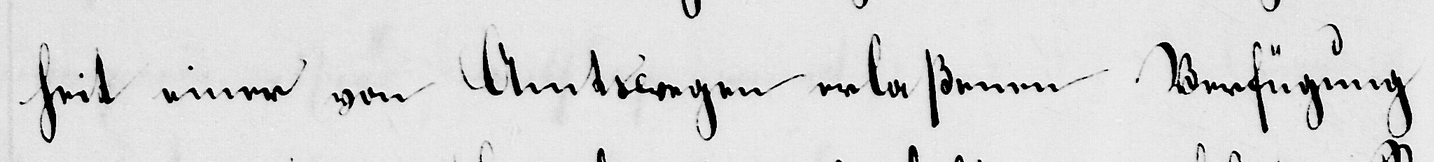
heit einer von Amtswegen erlaßenen Verfügung
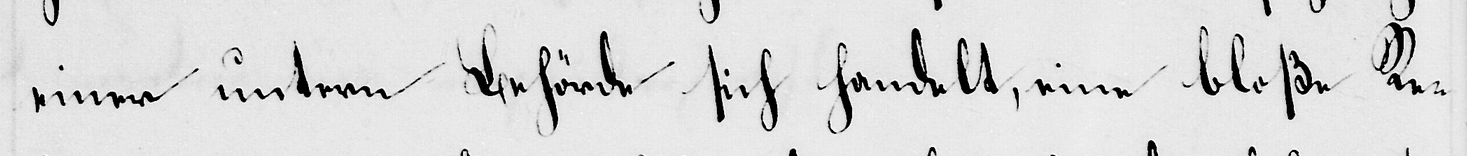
einer untern Behörde sich handelt, eine bloße Re¬
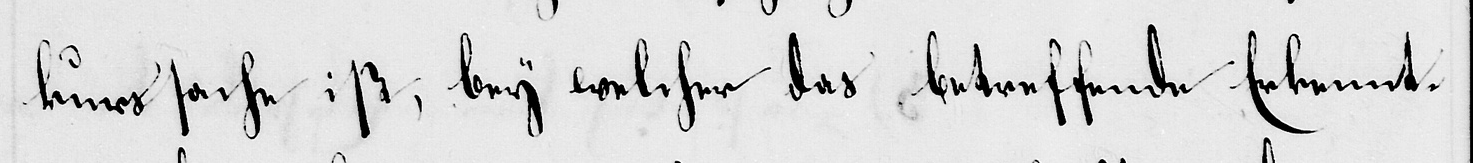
kurssache ist, bey welcher das betreffende Erkennt¬
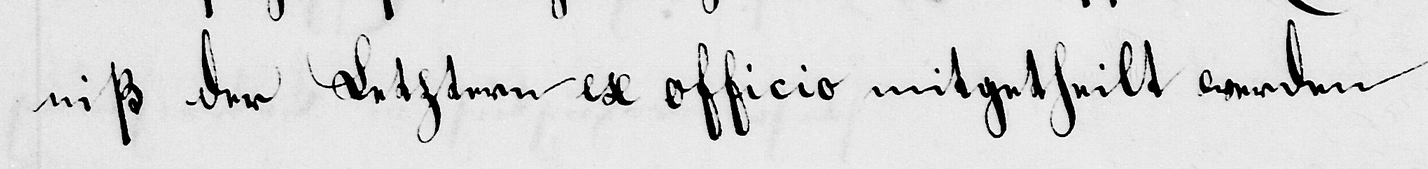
niß der Letztern ex officio mitgetheilt werden
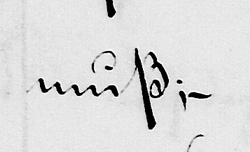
muß: –
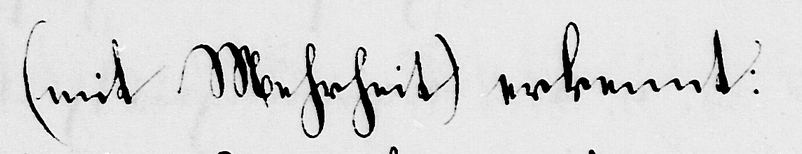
(mit Mehrheit) erkennt:
